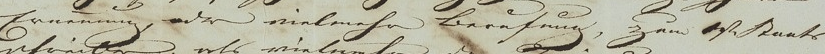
Ernennung, oder vielmehr Berufung, zum 1sten Staats-
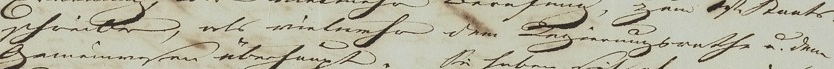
schreiber, als vielmehr dem Regierungsrathe u. dem
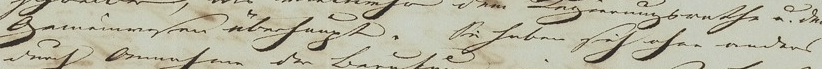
Gemeinwesen überhaupt. Sie haben sich ohne anders
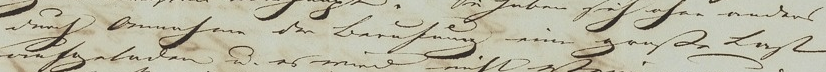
durch Annahme der Berufung eine große Last
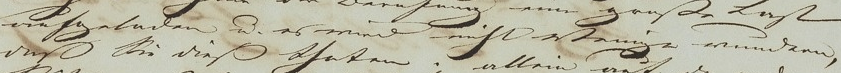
aufgeladen u. es wird nicht Wenige wundern,
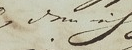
den ich
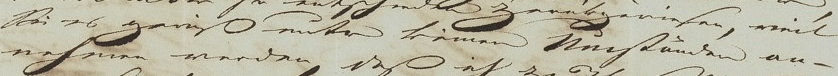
Sie es gewiß unter keinen Umständen an-
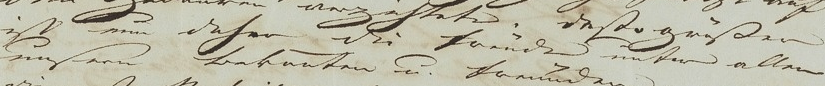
ist nun daher die Freude unter allen
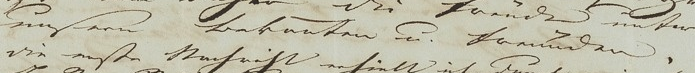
unsern Bekannten u. Freunden. –
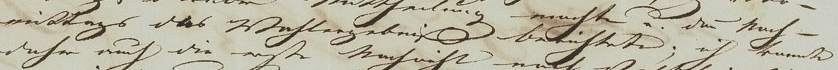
mittags das Wahlergebniß berichtete; ich konnte
